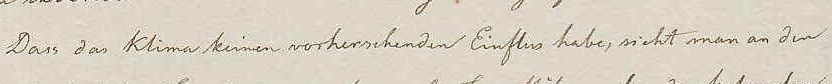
Dass das Klima keinen vorherschenden Einflus habe, sieht man an den
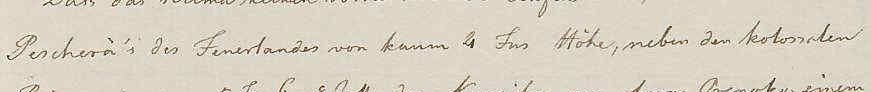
Pescherä's des Feuerlandes von kaum 4 Fus Höhe, neben den kolossalen
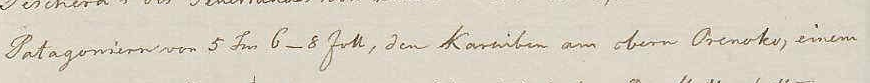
Patagoniern von 5 Fus 6–8 Zoll, den Karaiben am obern Orinoko, einem
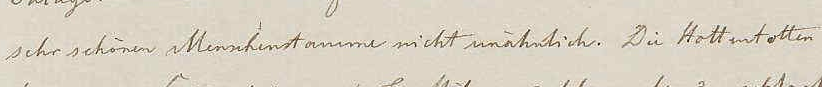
sehr schönen Menschenstamme nicht unähnlich. Die Hottentotten
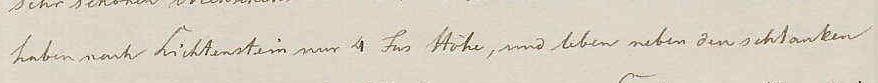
haben nach Lichtenstein nur 4 Fus Höhe, und leben neben den schlanken
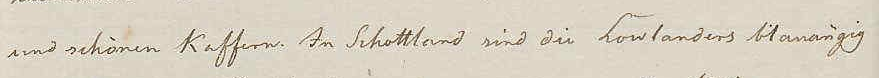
und schönen Kaffern. In Schottland sind die Lowlanders blauäugig
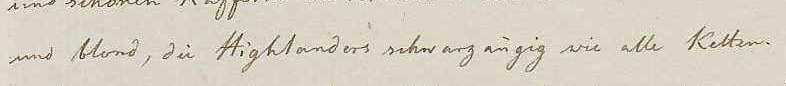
und blond, die Highlanders schwarzäugig wie alle Kelten.
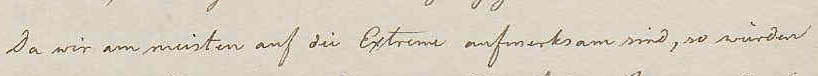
Da wir am meisten auf die Extreme aufmerksam sind, so würden
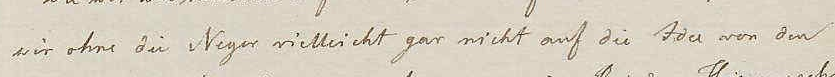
wir ohne die Neger vielleicht gar nicht auf die Idee von den
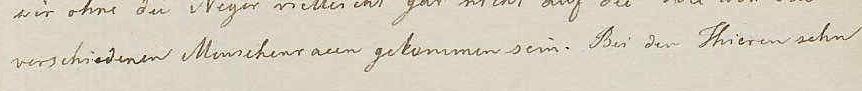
verschiedenen Menschenracen gekommen sein. Bei den Thieren sehn
